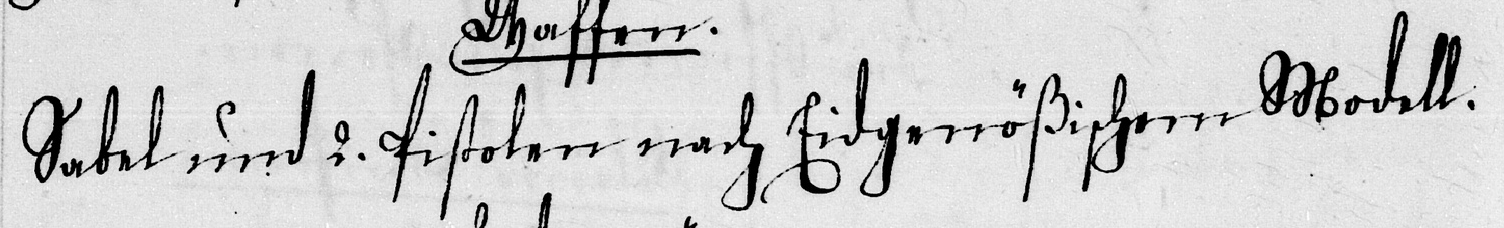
Sabel und 2. Pistolen nach Eidgenößischem Modell.
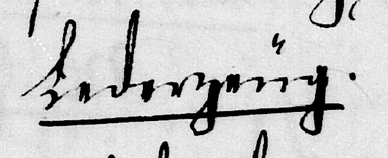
Lederzeug.
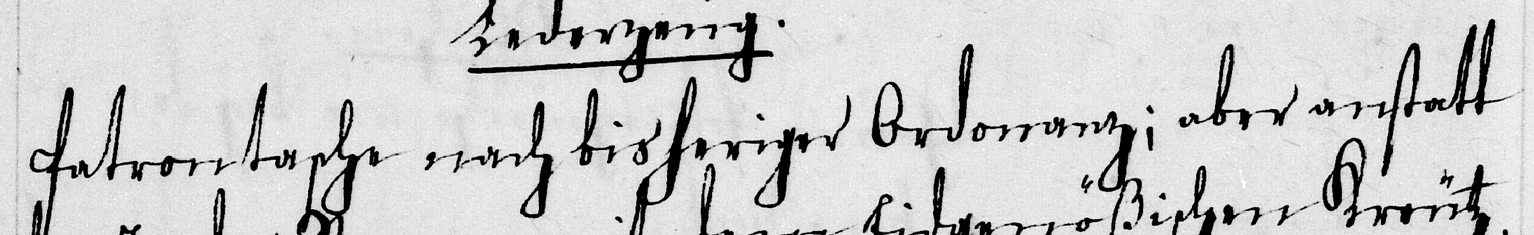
Patrontasche nach bisheriger Ordonanz; aber anstatt
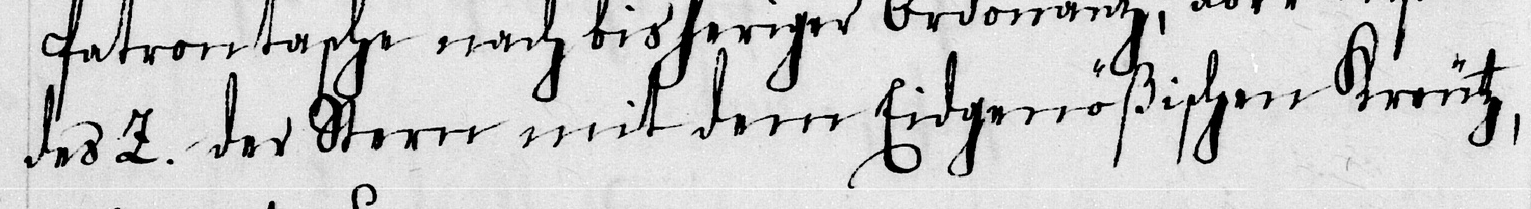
des Z. der Stern mit dem Eidgenößischen Kreutz,
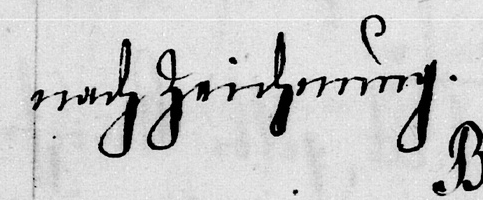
nach Zeichnung.
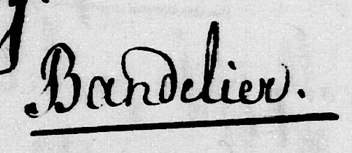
Bandelier.
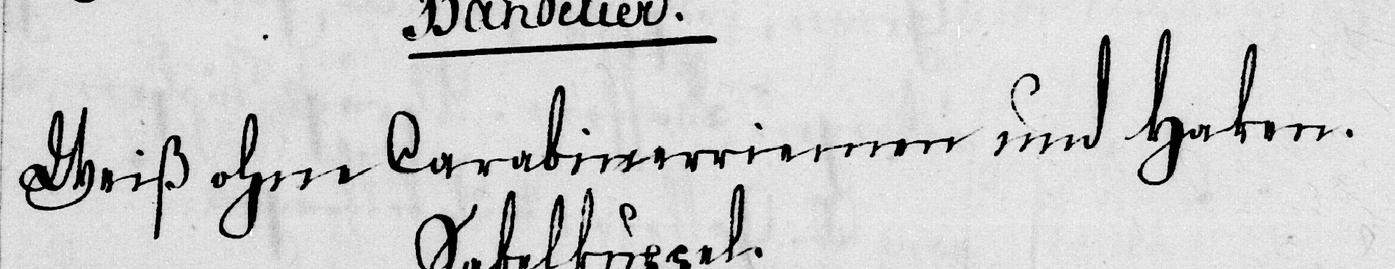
Weiß ohne Carabinerriemen und Haken.
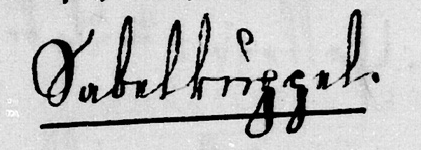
Sabelkuppel.
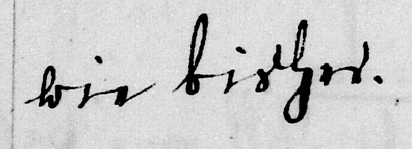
wie bisher.
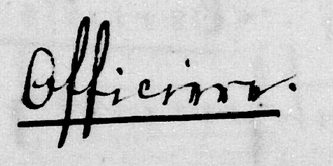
Officiere.
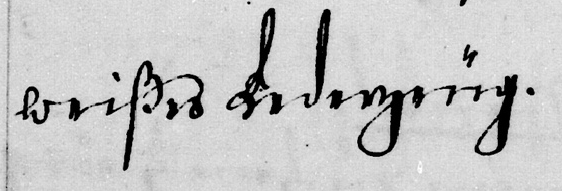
weißes Lederzeug.
